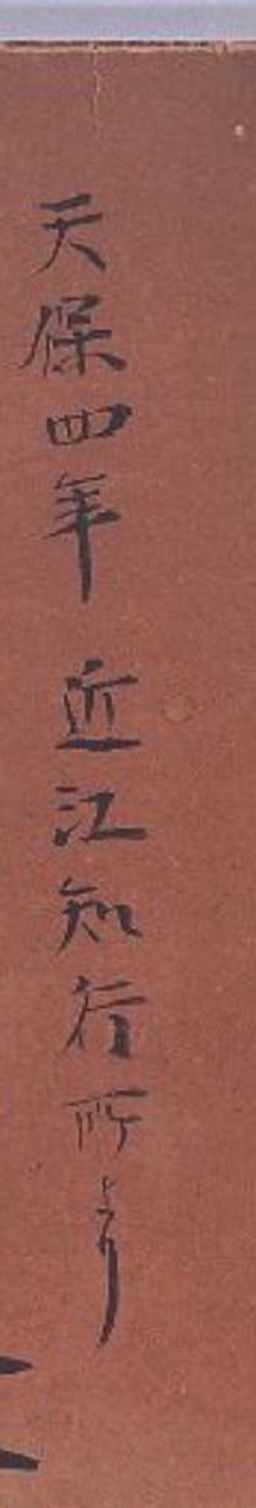天保四年近江知行所より
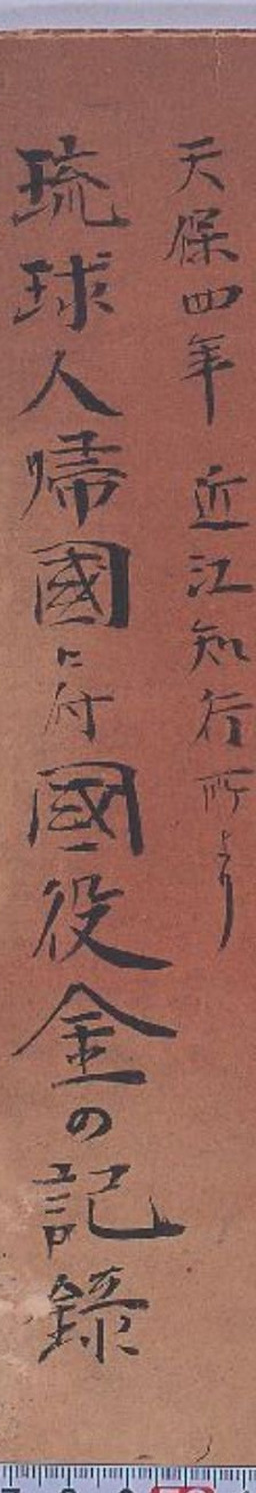琉球人帰国に付国役金の記録

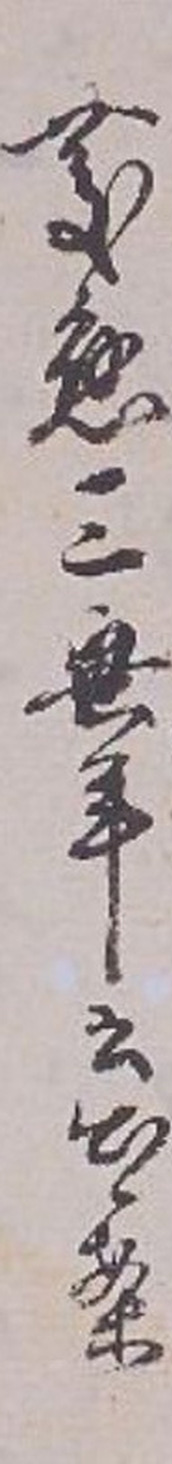慶応三年書出候案

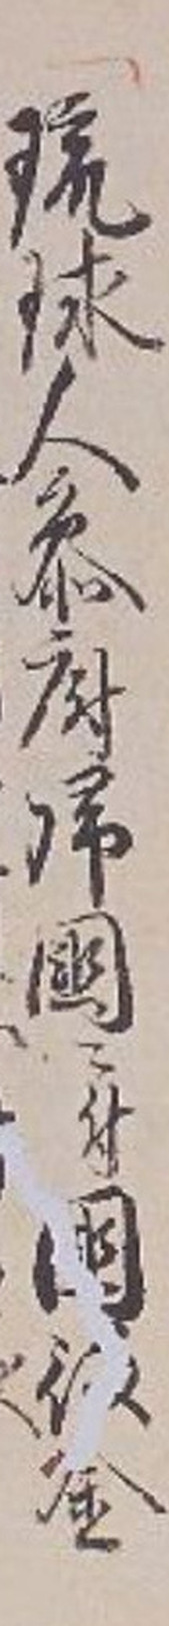琉球人参府帰国に付国役金
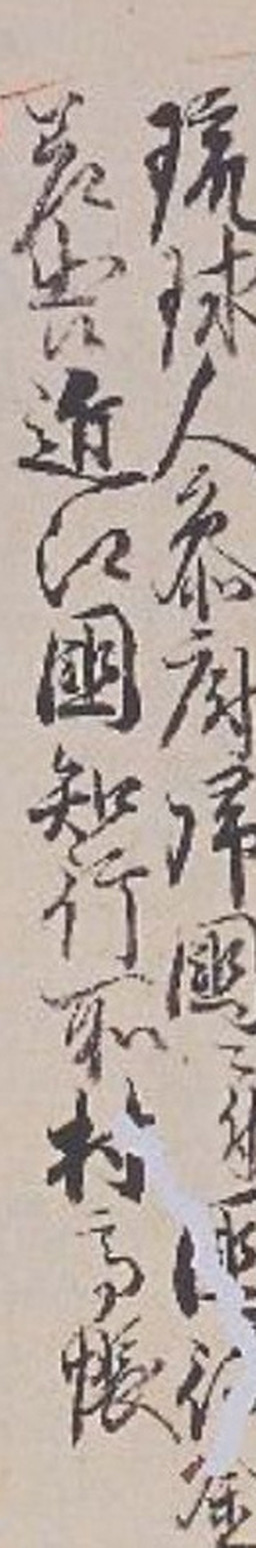差出候近江国知行所村高雕帳
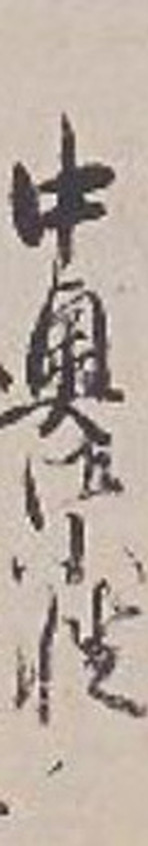中奥御小姓
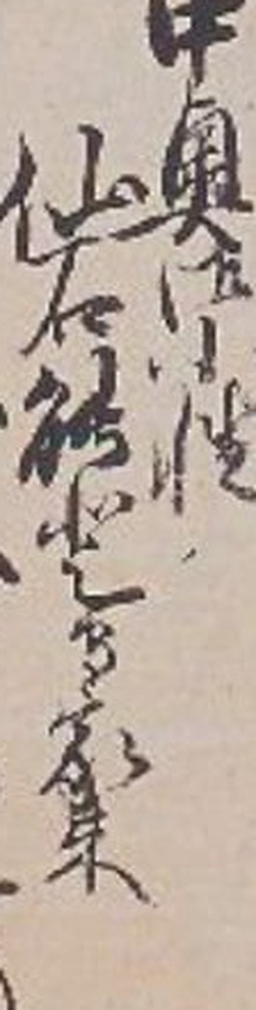仙石能登守家来
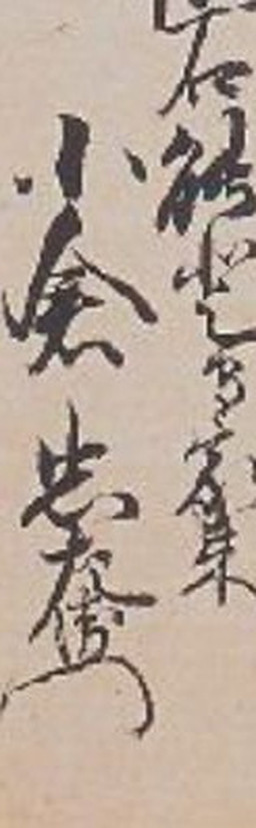小倉忠左衛門
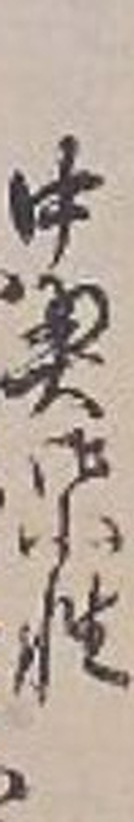中奥御小姓
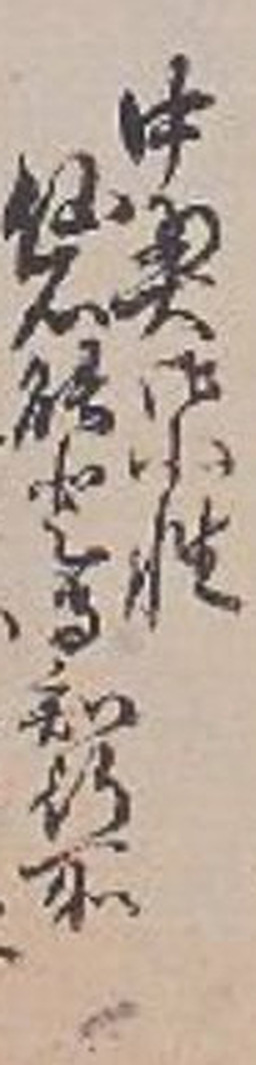仙石能登守知行所
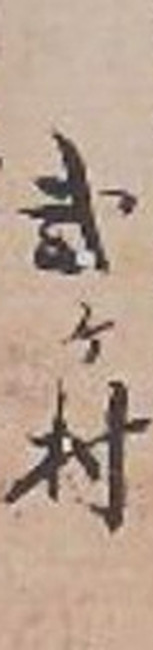二ヶ村
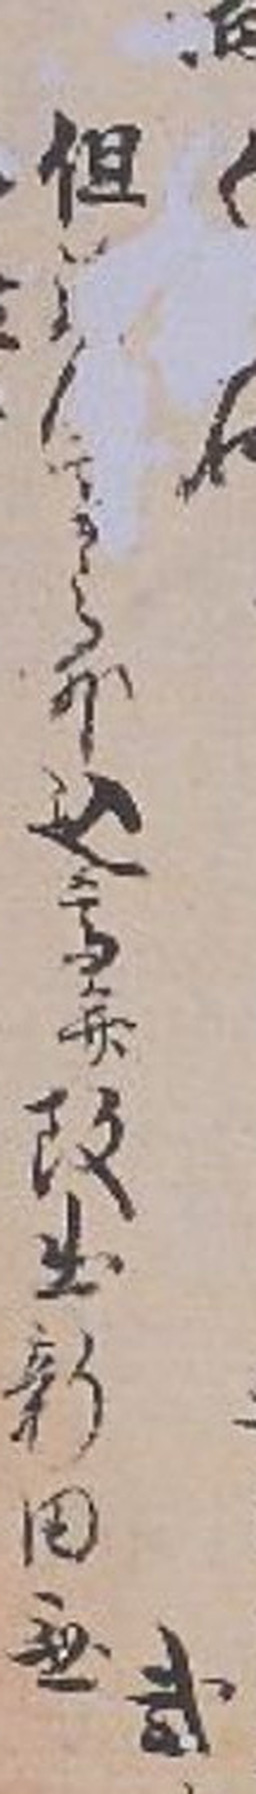但高之外込高幷阪出新田無
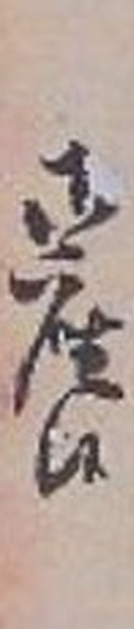御座候

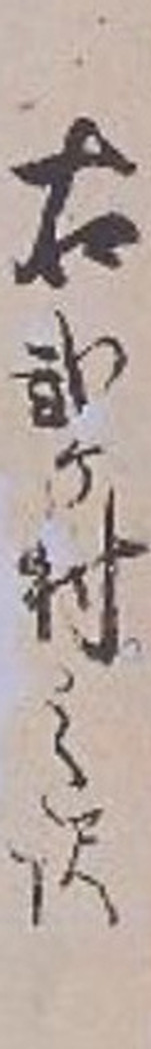右二ヶ村之訳
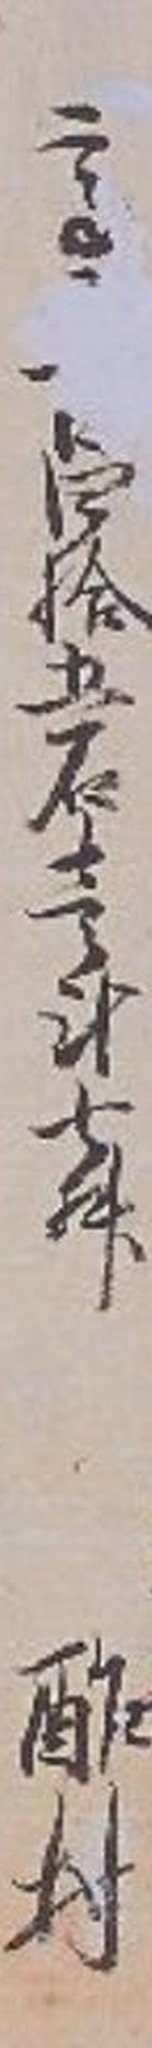高四拾五石一斗七升浅井郡
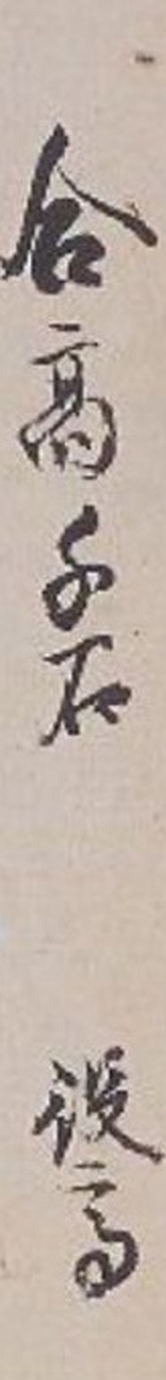合高千石役高
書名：琉球人帰国に付国役金の記録
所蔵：University of the Ryukyus Library
